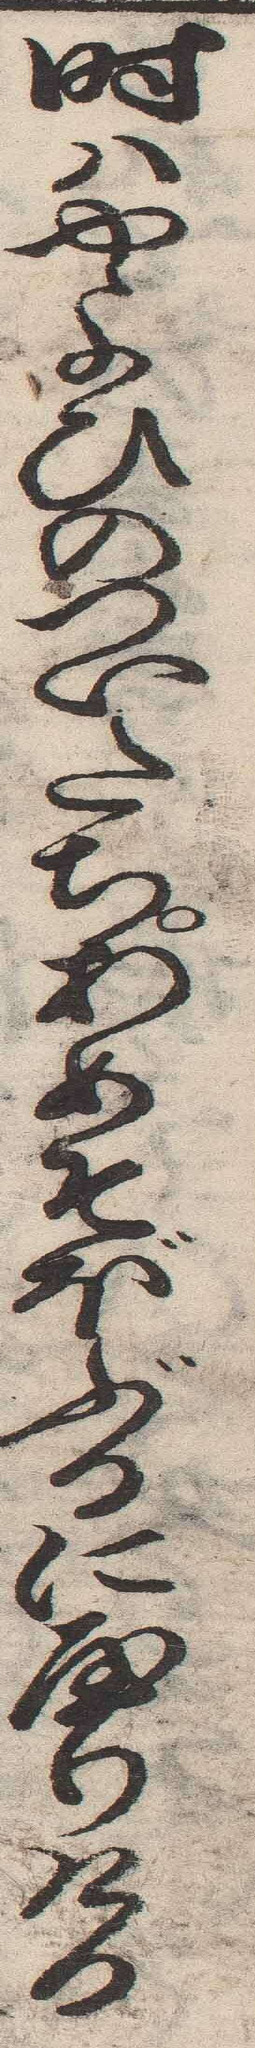時はやよひつのいたち。あめそぼぶるにやりける
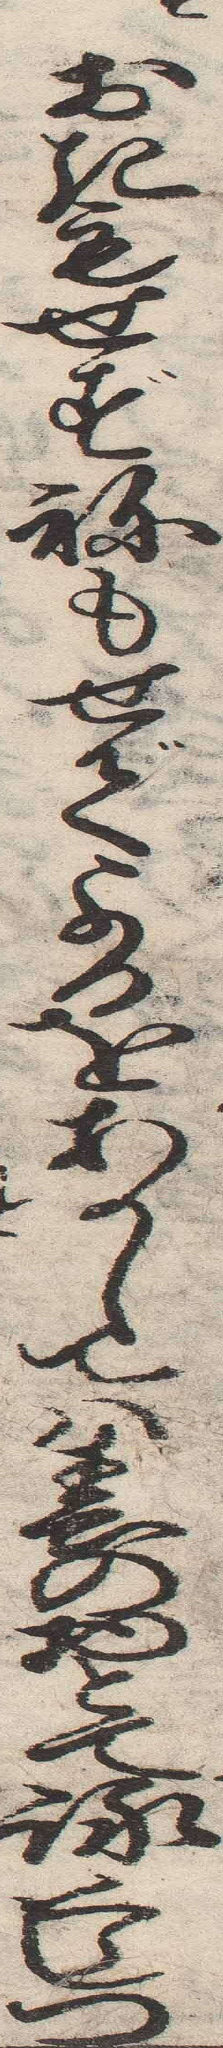古今おきもせずねもせでよるをあかしては春の物とて詠くらしつ
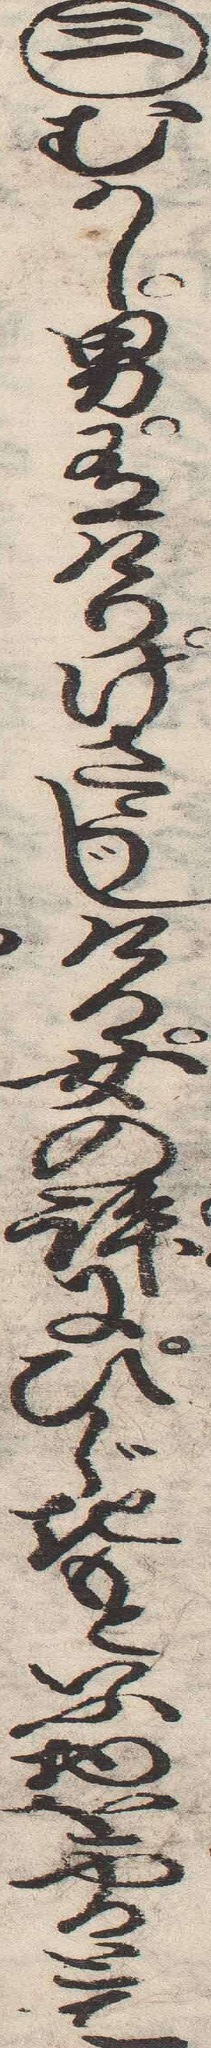㊂むかし。男。有けり。けさうじける。女の許に。ひじきもといふ物をやるとて
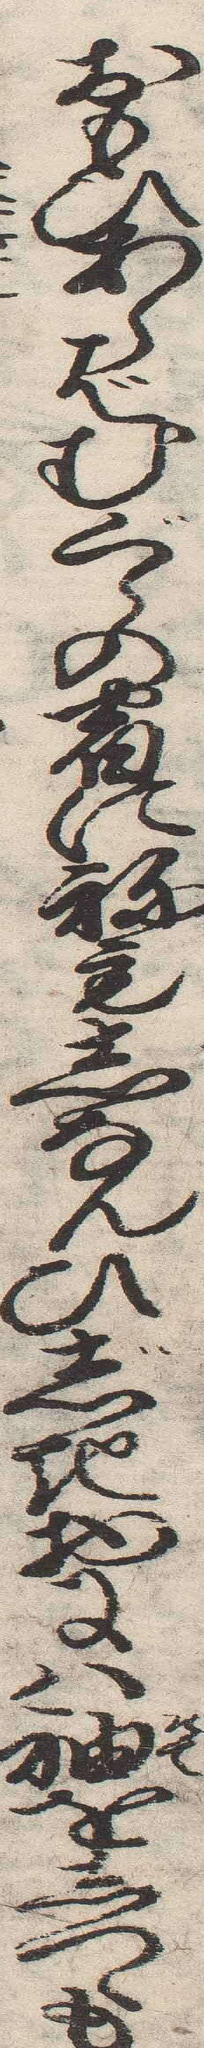おもひあらばむぐらの宿にねもしなんひじき物には袖をしつゝも
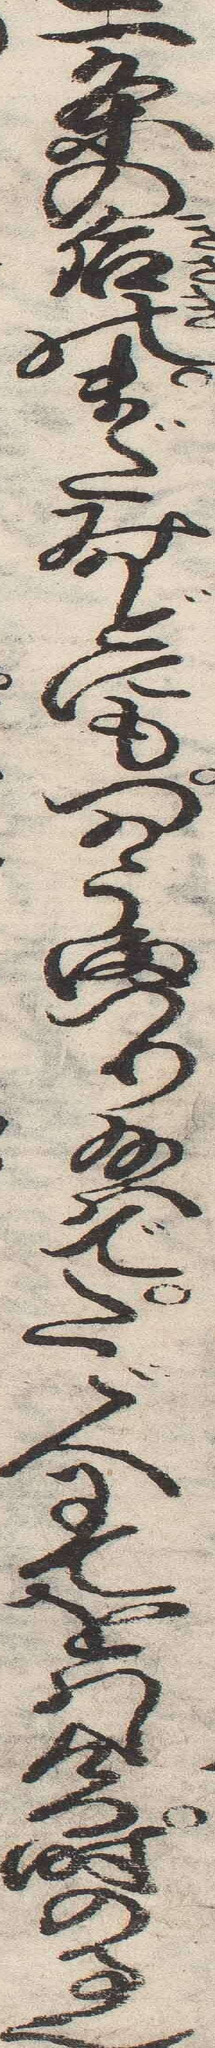二条の后の。まだみかどにも。つかうまつり給はで。たゞ人にてをはしける。時の事也
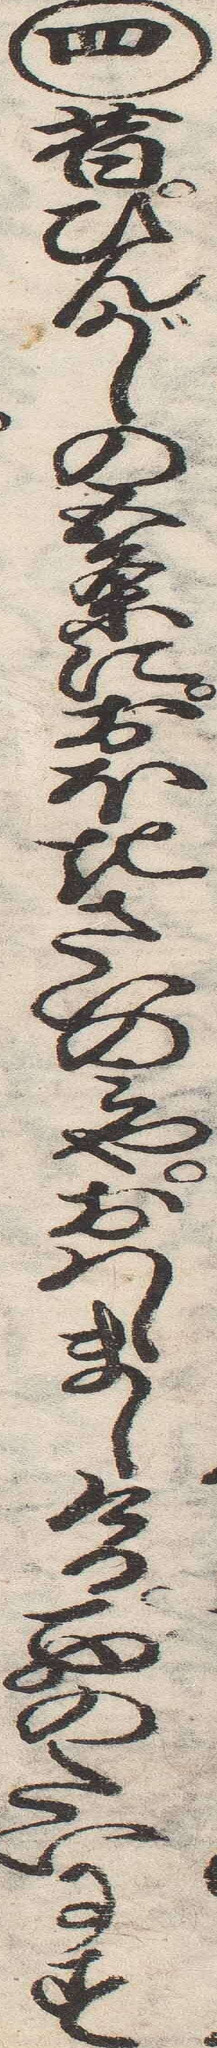㊃昔。ひんがしの五条に。おほきさいのみや。おはしましける。西のたいにす
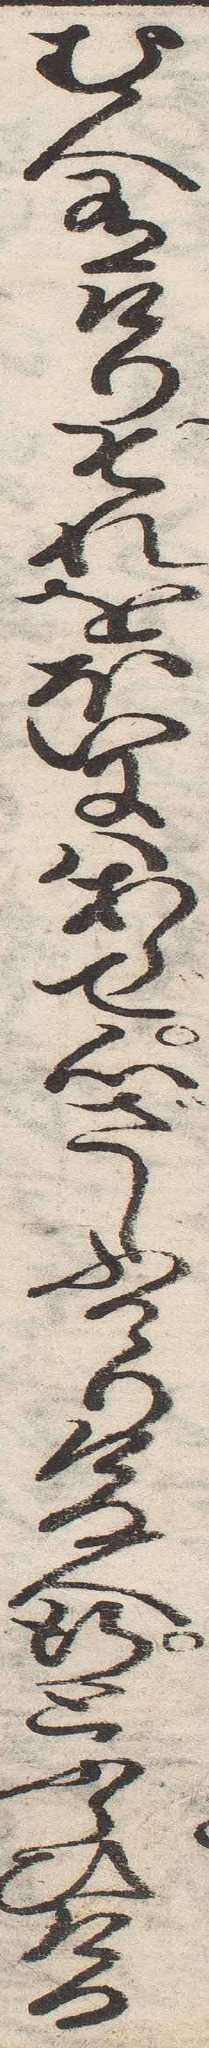む人有けり。それをほいにはあらで。心ざしふかゝりける人。行とふらひける
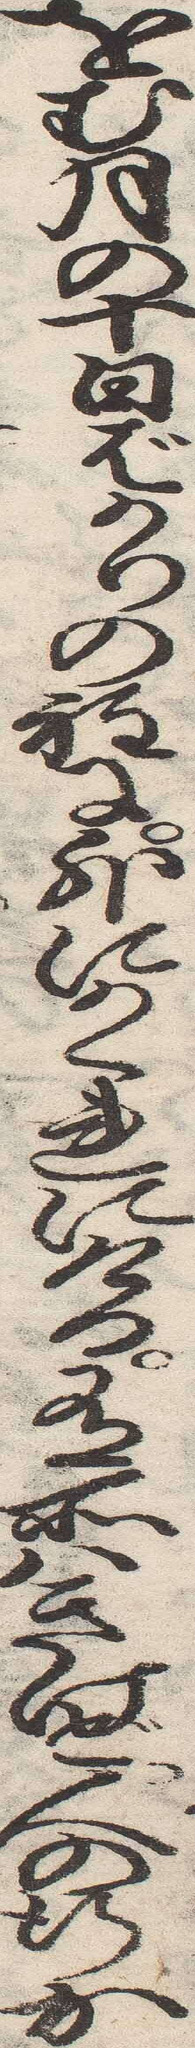をむ月の十日ばかりの程に。外にかくれにける。有所はきけど。人の行か
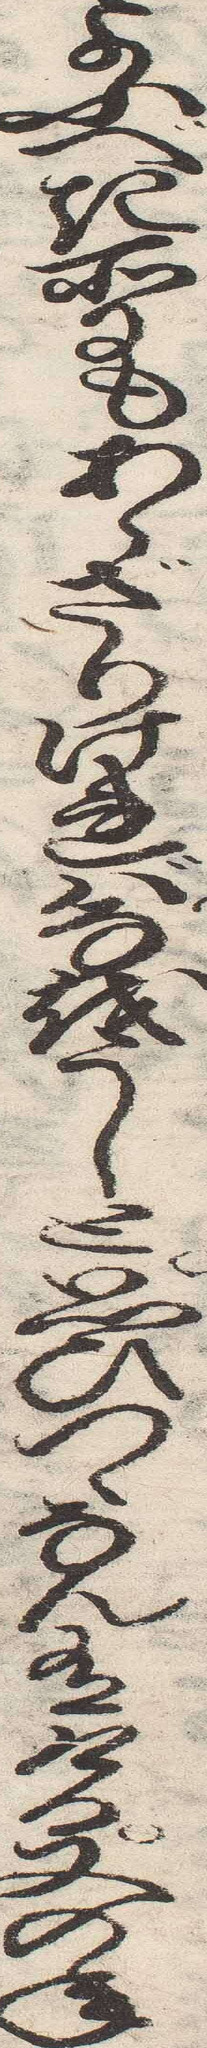よふべき所にも。あらざりければ。なをうしと。思ひつゝなん有ける。又の年
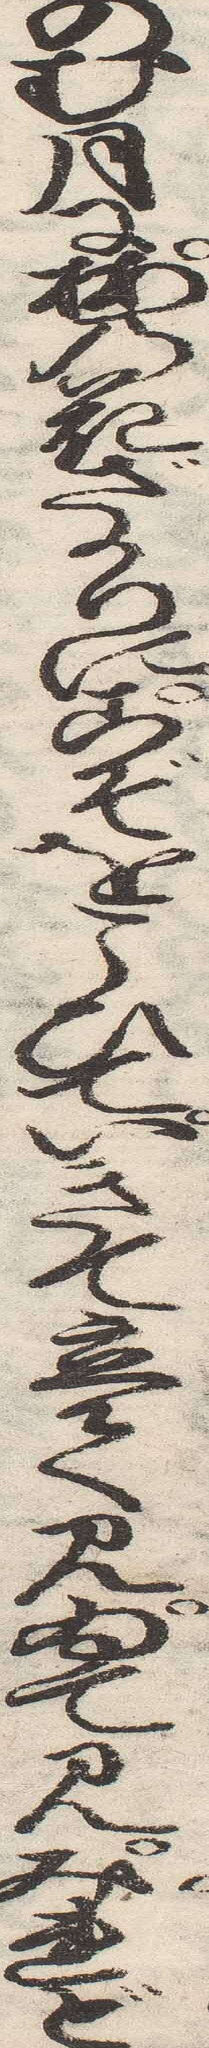のむ月に。梅の花ざかりに。こぞをこひて。いきて立て見。ゐて見。みれど
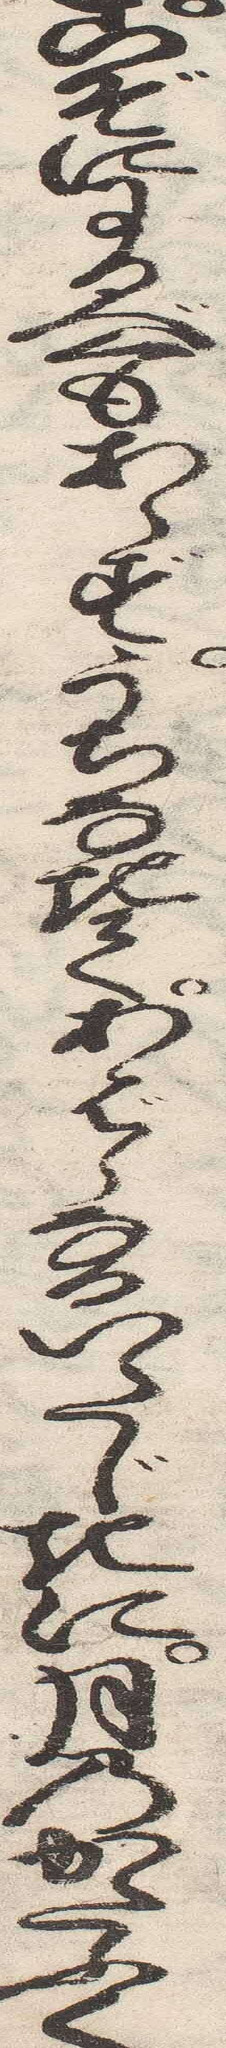。こぞににるべくもあらず。うちなきて。あばらなるいたじきに。月のかたふく
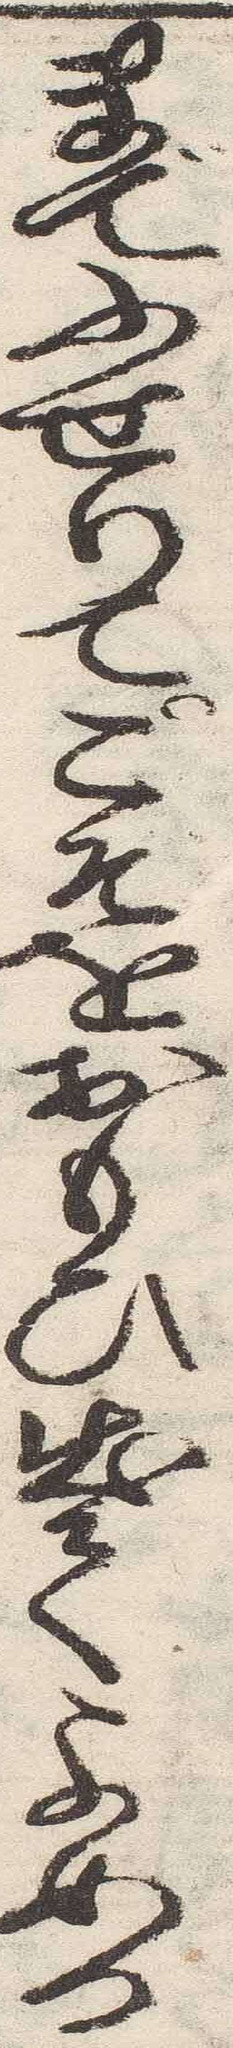までふせりて。こそをおもひ出てよめる
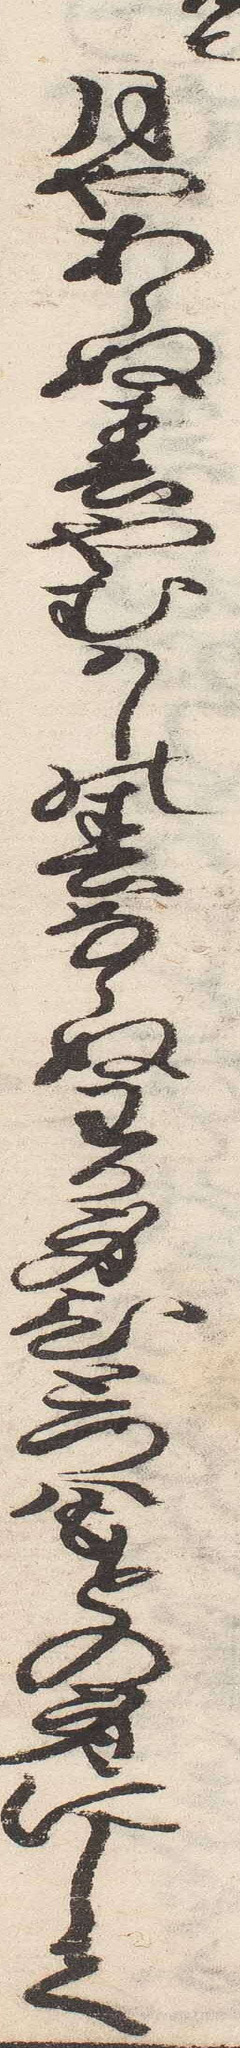古今月やあらぬ春やむかしの春ならぬわか身ひとつはもとの身にして

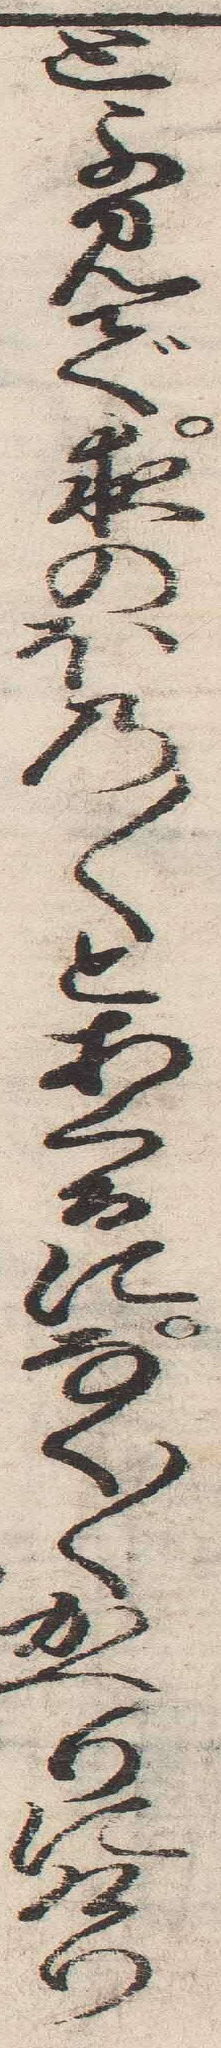とよみで。夜のほの〳〵とあくるに。なく〳〵かへりにけり
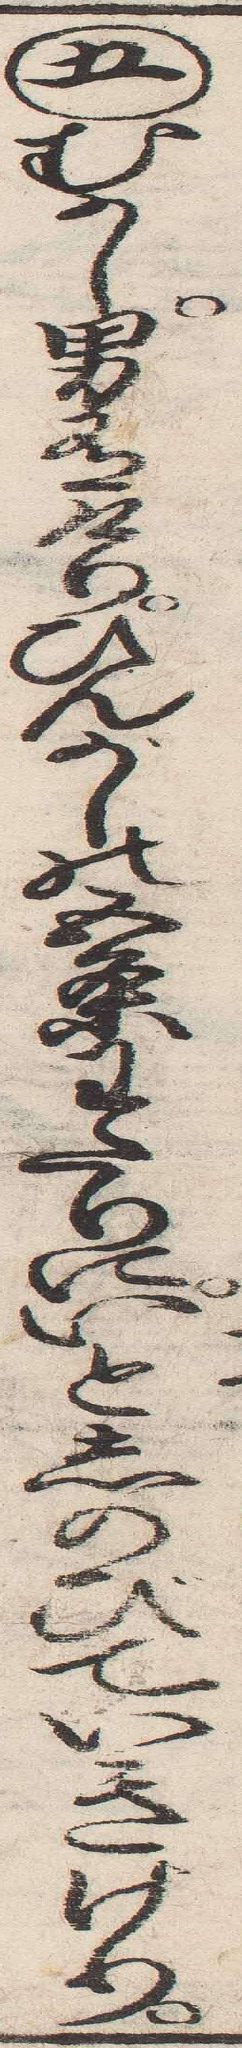㊄むかし。男有けり。ひんがしの五条わたりに。いとしのびていきけり。
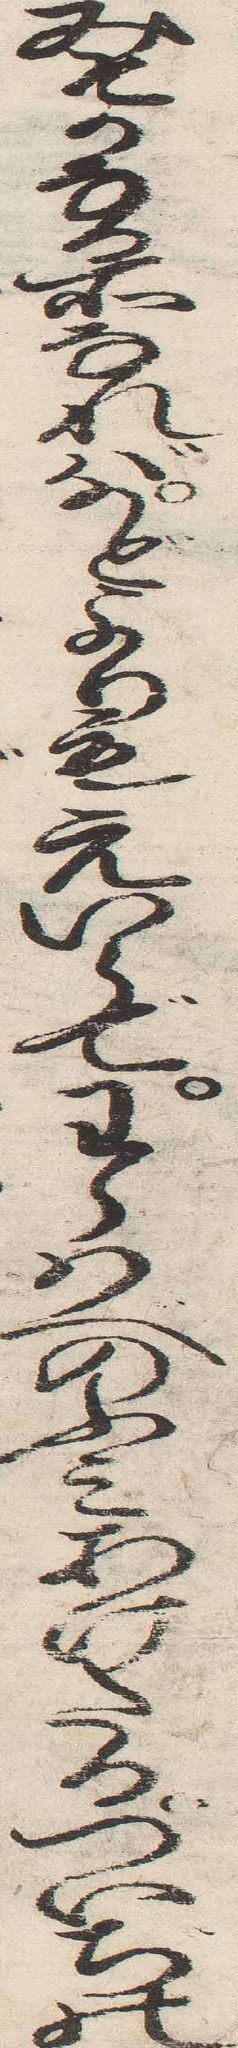みそかなる所なれば。かどよりもえいらで。わらはべのふみあけたる。ついぢの
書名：伊勢物語
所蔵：東京学芸大学附属図書館 国文学研究資料館
